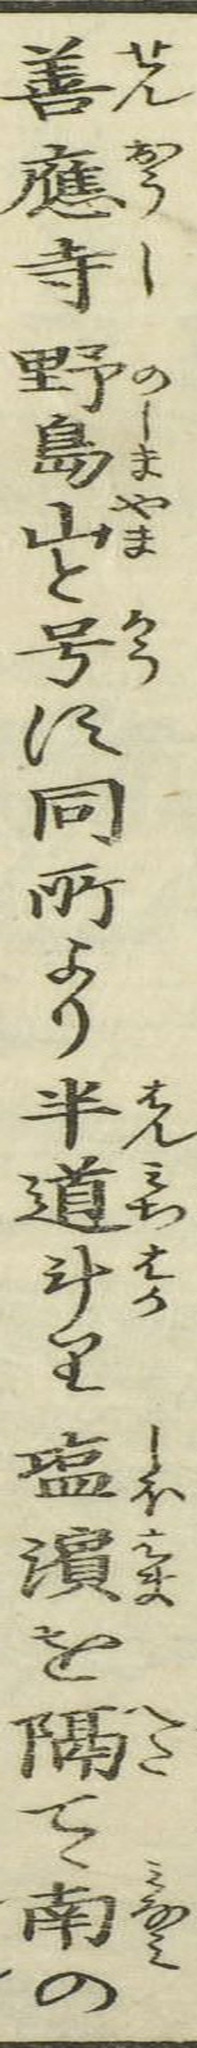善應寺野島山と号す同所より半道斗り塩濵を隔てゝ南の
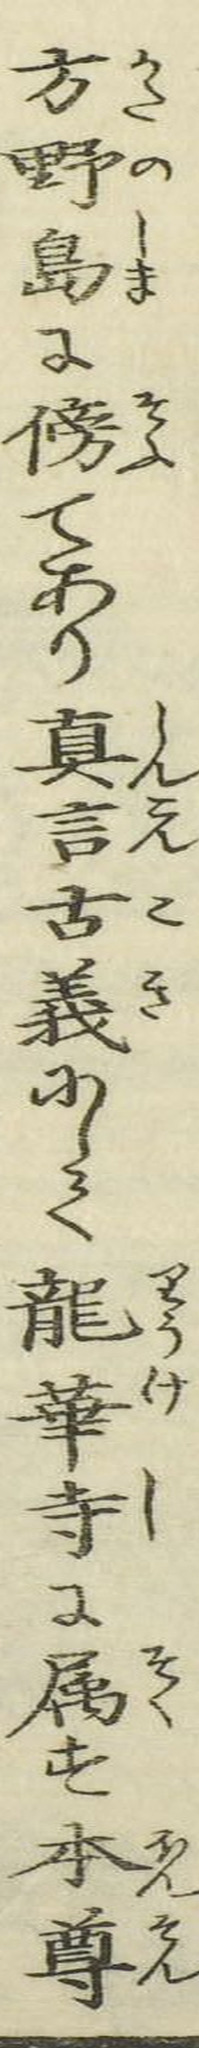方野島に傍てあり真言古義にて龍華寺に属す本尊
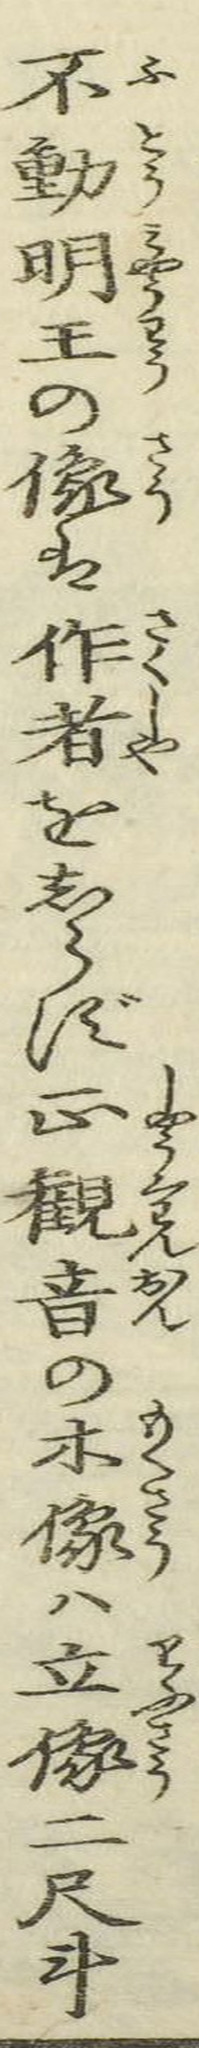不動明王の像は作者をしらず正観音の木像は立像二尺斗
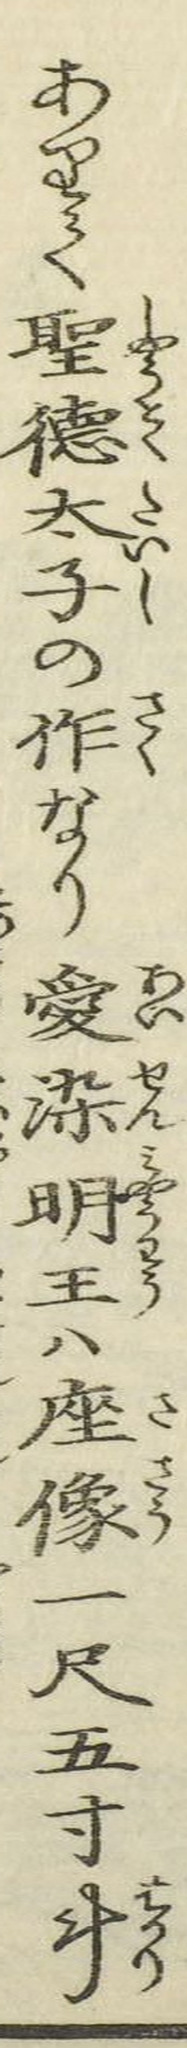ありて聖徳太子の作なり愛染明王は座像一尺五寸斗
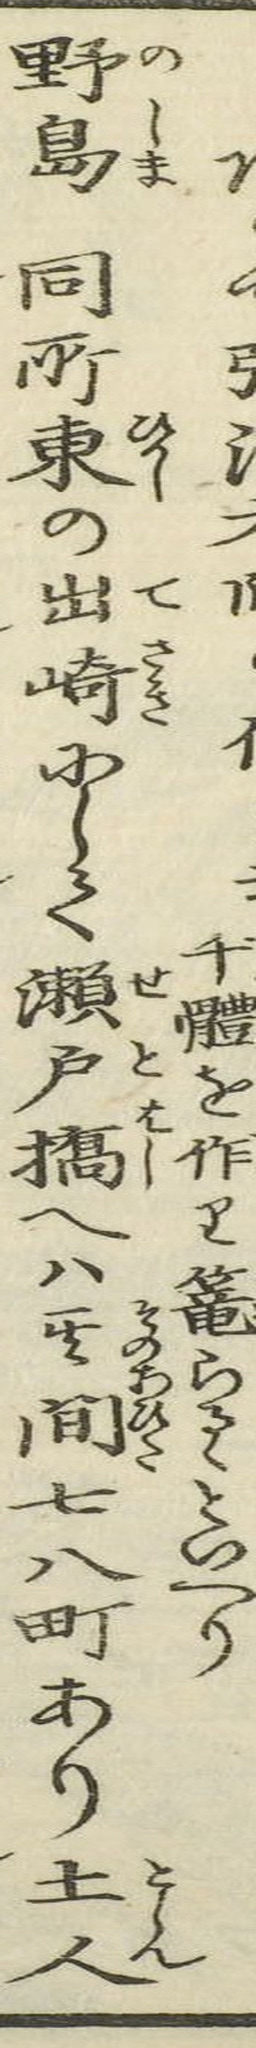野島同所東の出崎にして瀬戸橋へは其間七八町あり土人
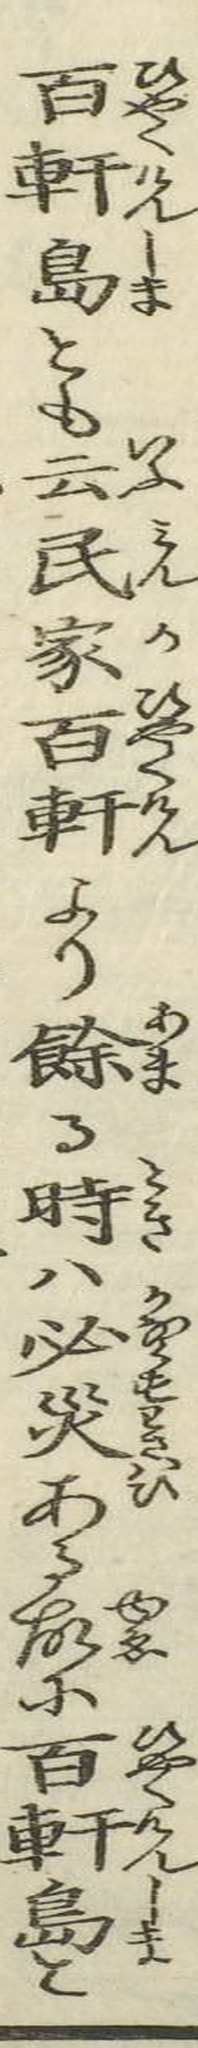百軒島とも云民家百軒より餘る時は必災ある故に百軒島と
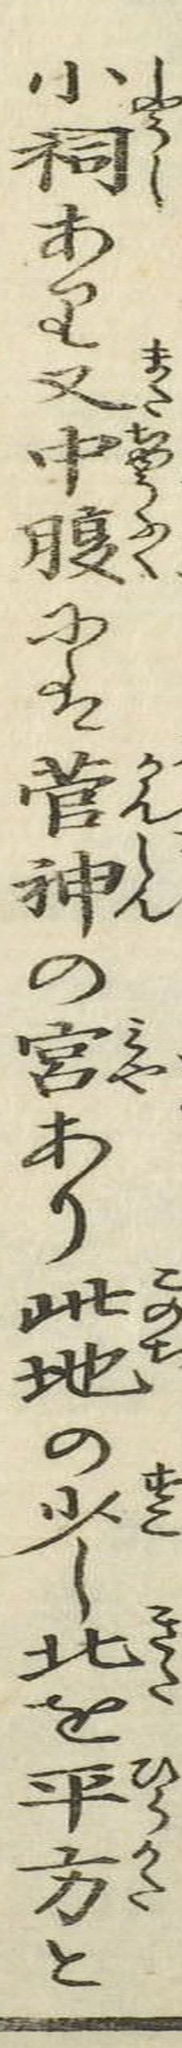小祠あり又中腹には菅神の宮あり此地の少し北を平方と
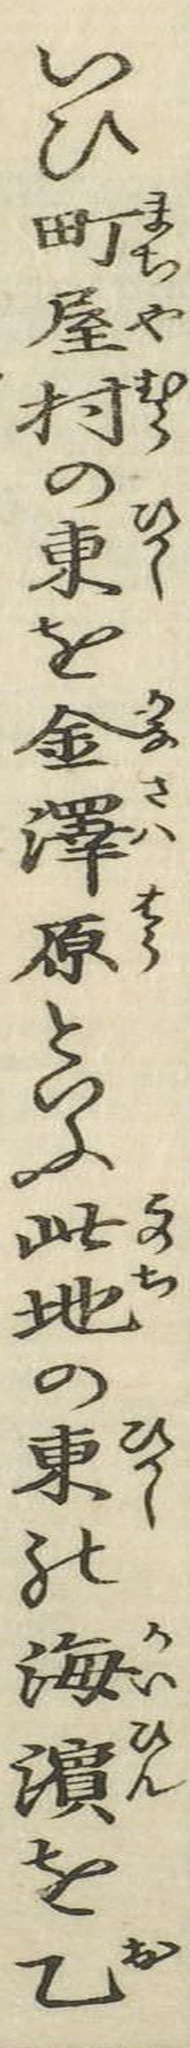いひ町屋村の東を金澤原といふ此地の東の海濵を乙
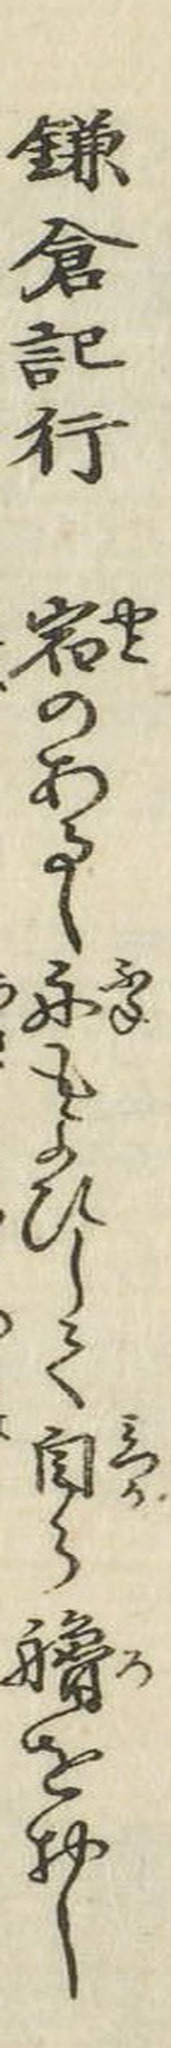鎌倉記行宿のあるし舟もよひして自ら艪をおし
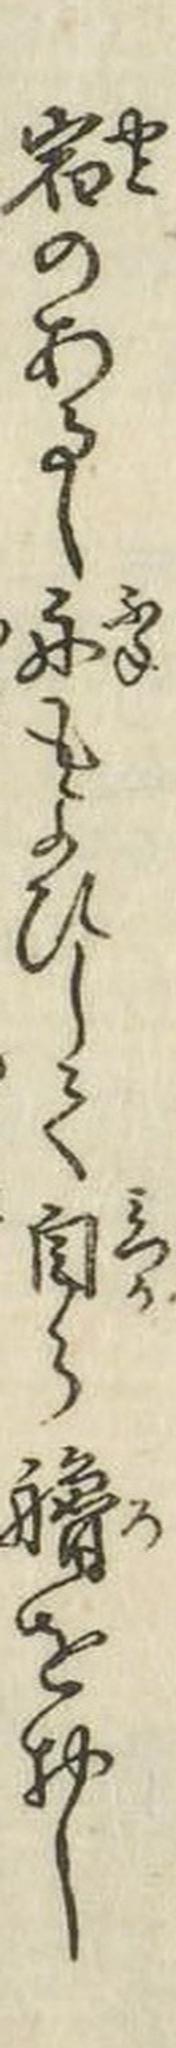鎌倉記行宿のあるし舟もよひして自ら艪をおし
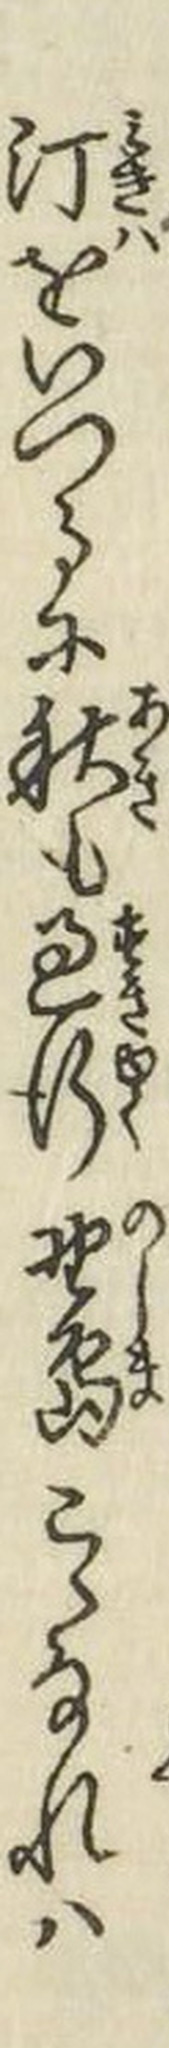汀をいつるに秋も過行野島こゝなれは
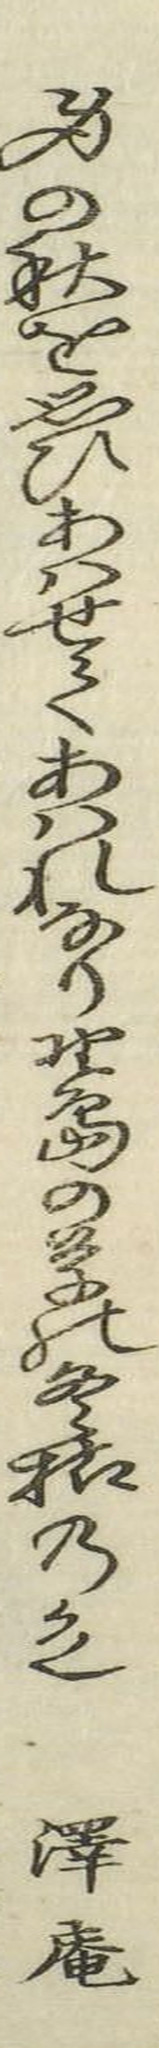身の秋を思ひあはせてあはれなり野島の草の冬枯の色澤庵
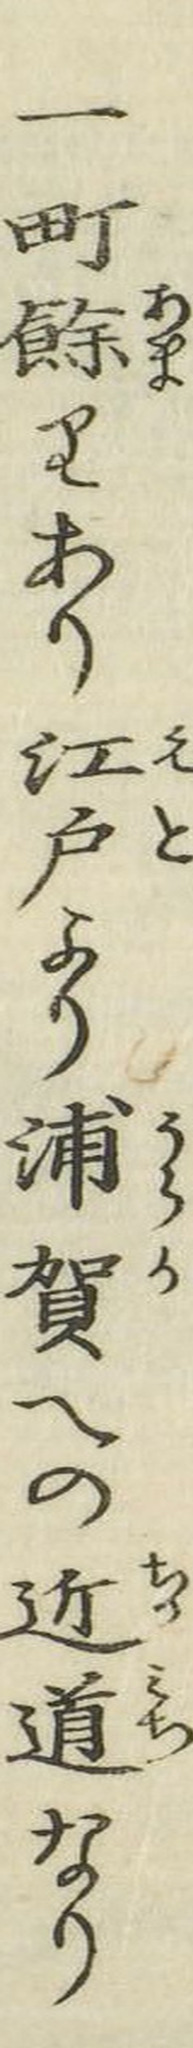一町餘りあり江戸より浦賀への近道なり
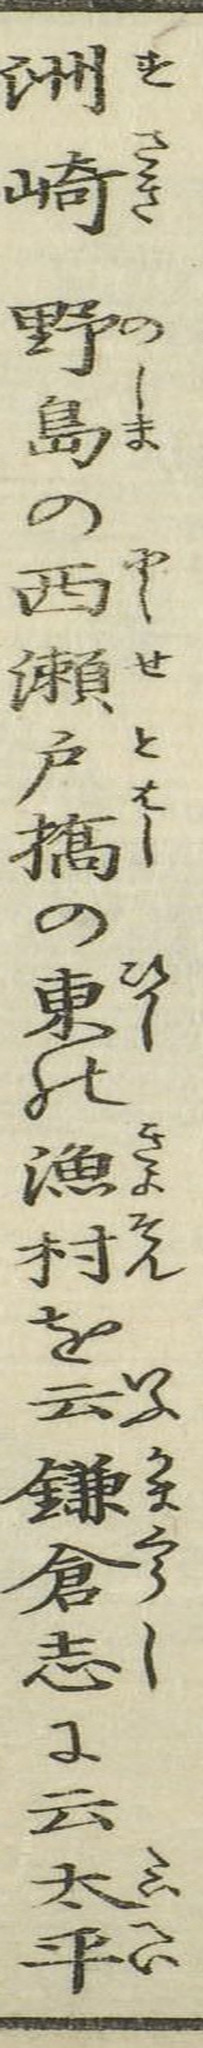洲崎野島の西瀬戸橋の東の漁村を云鎌倉志に云太平
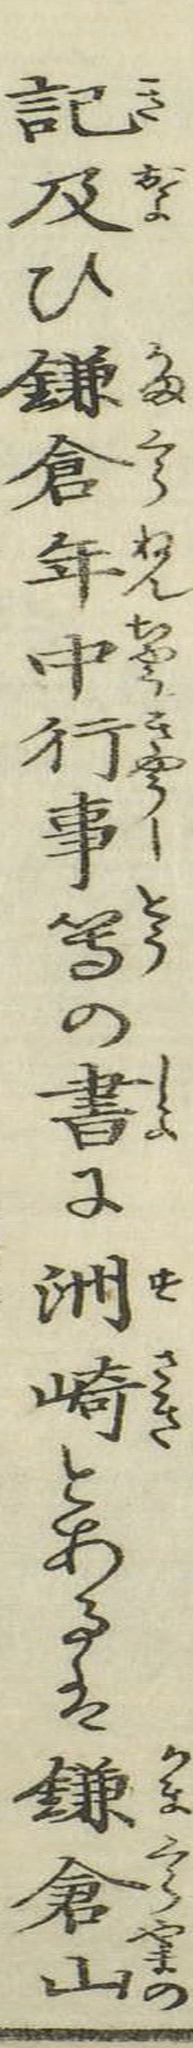記及ひ鎌倉年中行事等の書に洲崎とあるは鎌倉山
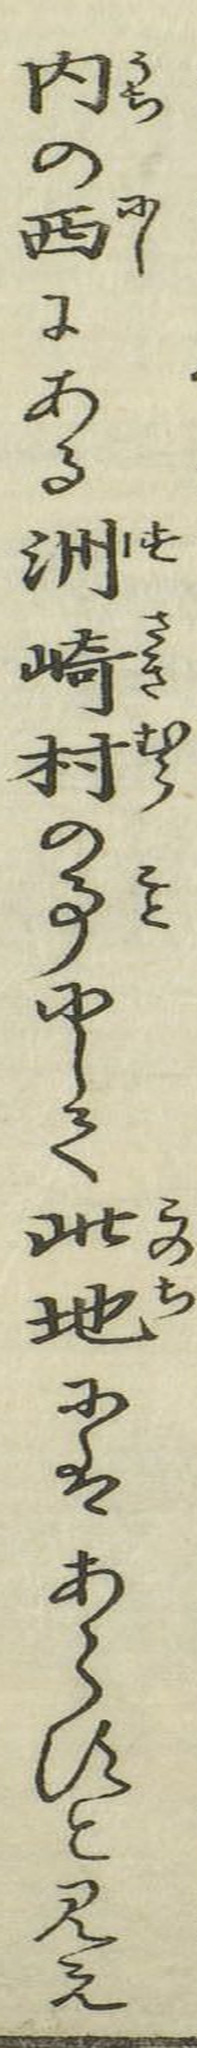内の西にある洲崎村の事にして此地にはあらすと見え
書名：江戸名所図会 20巻 巻之6
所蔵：東京学芸大学教育コンテンツアーカイブ
